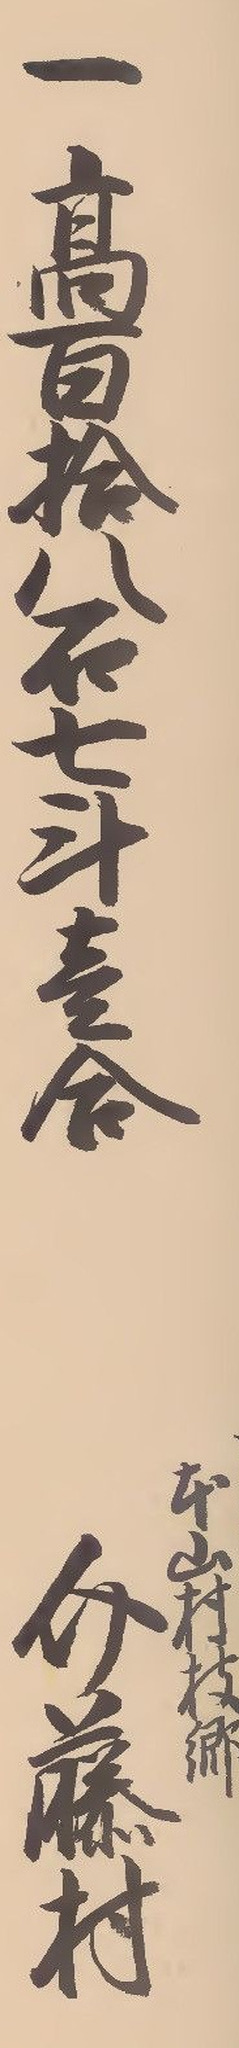一髙百拾八石七斗壱合介藤村
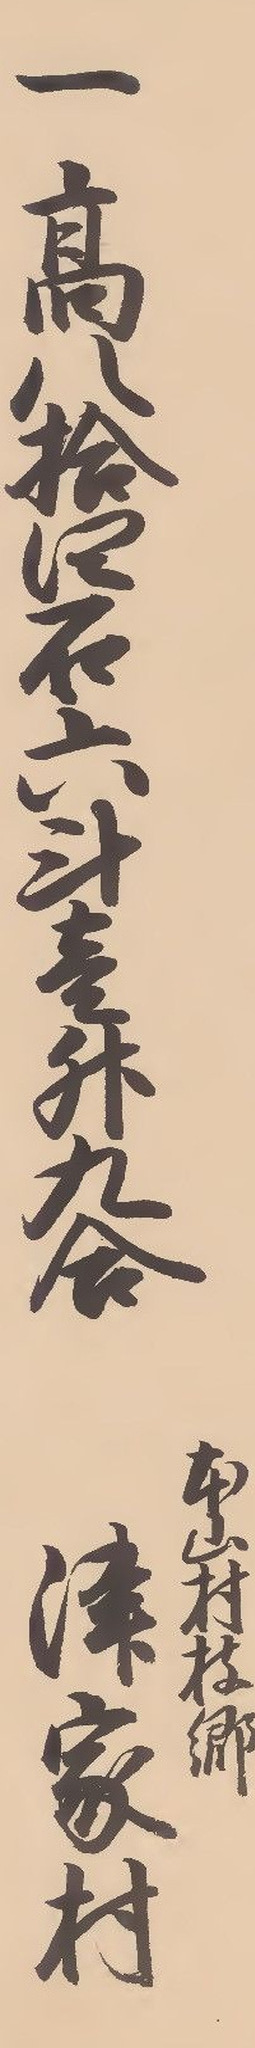一髙八拾四石六斗壱升九合津家村
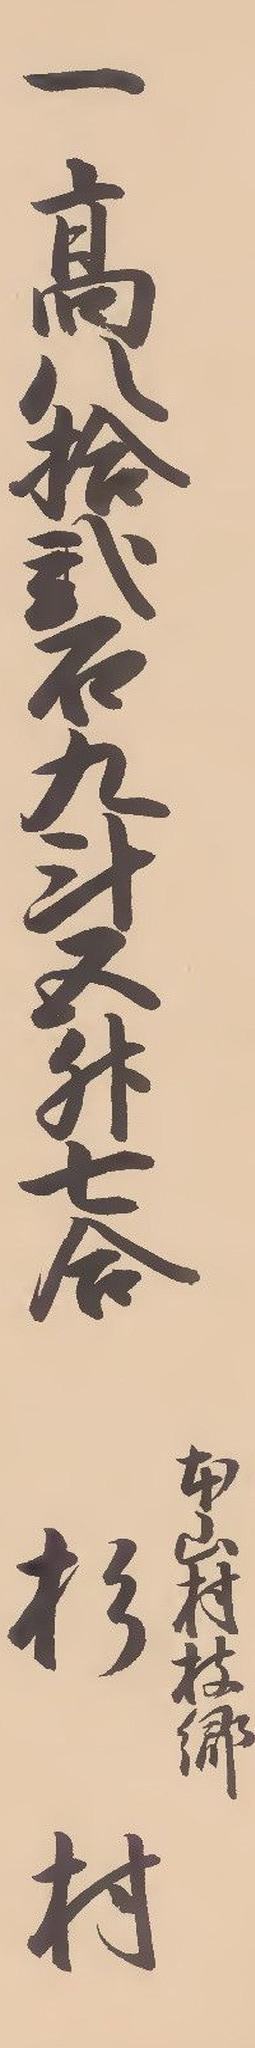一髙八拾弐石九斗五升七合杉村
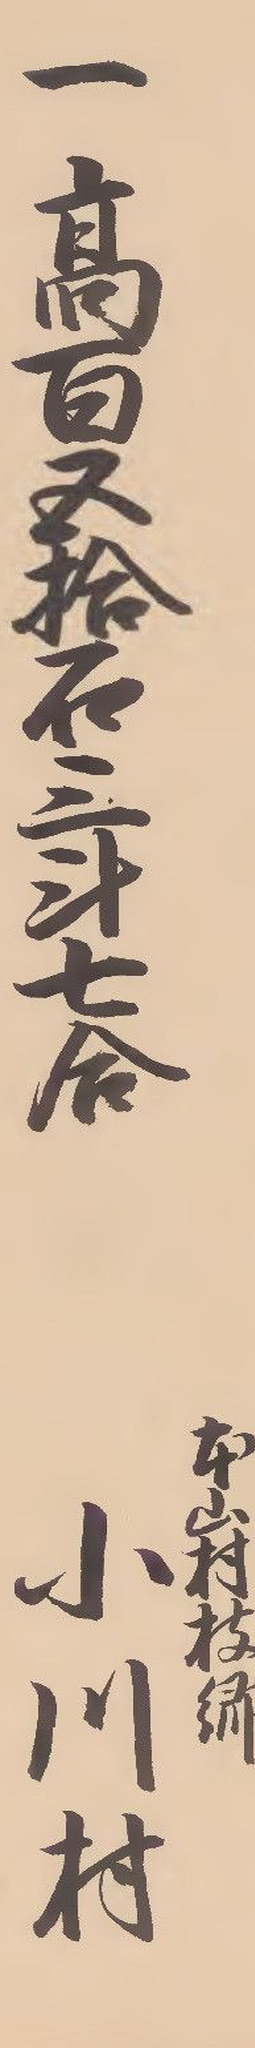一髙百五拾石三斗七合小川村

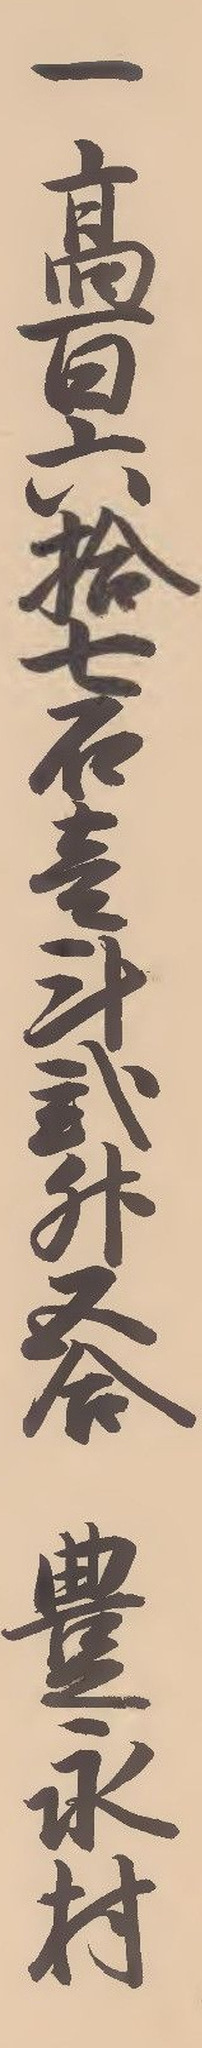一髙百六拾七石壱斗弐升五合豊永村
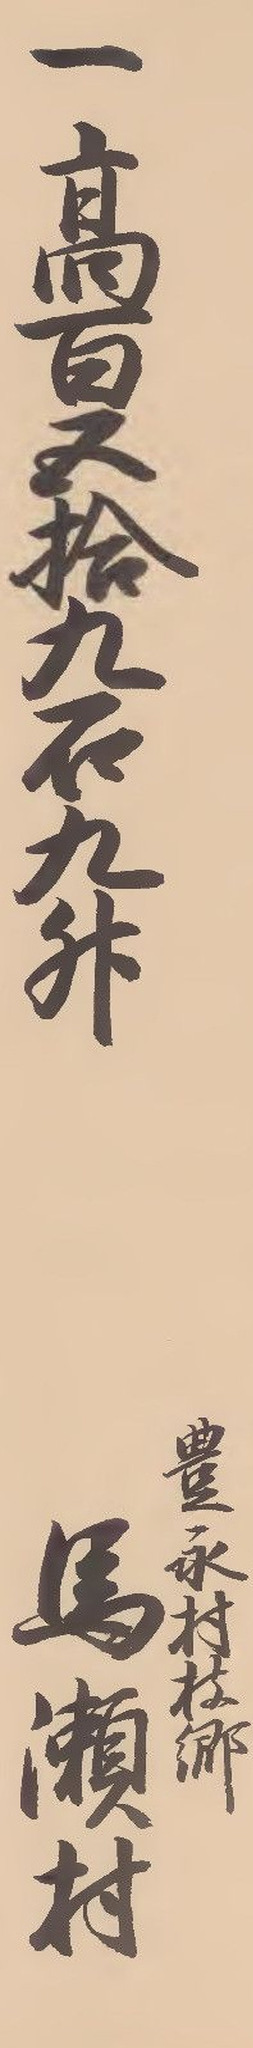一髙百五拾九石九升馬瀬村
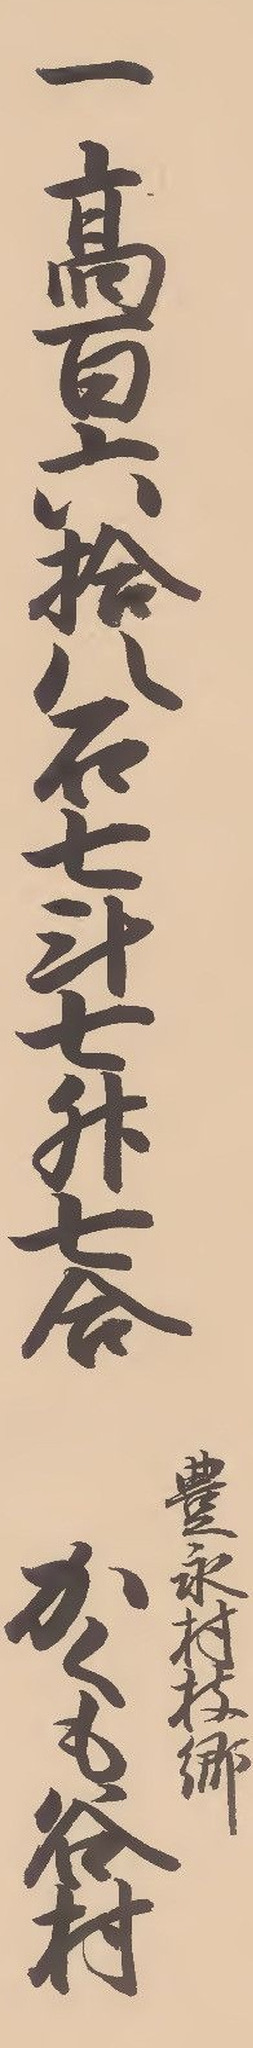一髙百六拾八石七斗七升七合かくも谷村
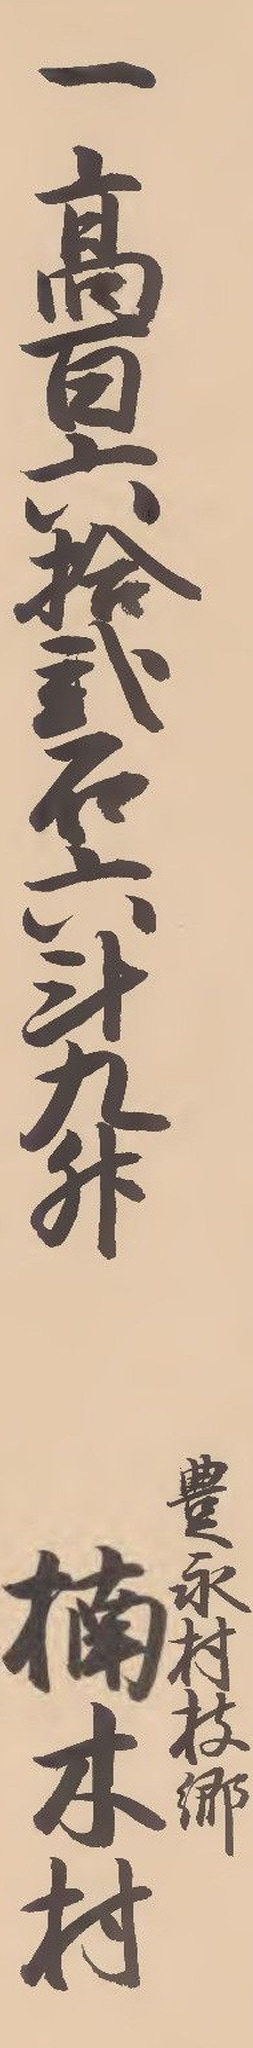一髙百六拾弐石六斗九升楠木村
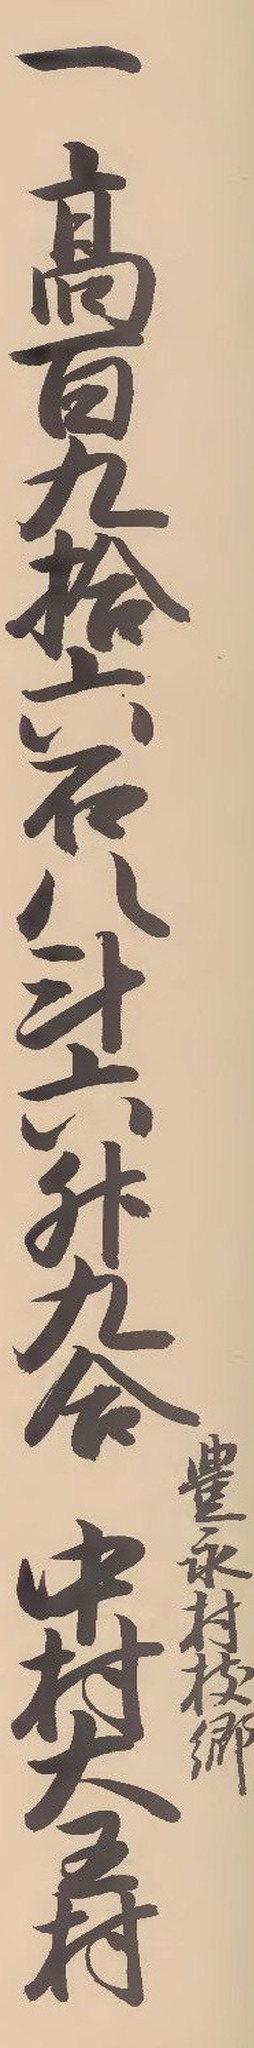一髙百九拾六石八斗六升九合中村大王村
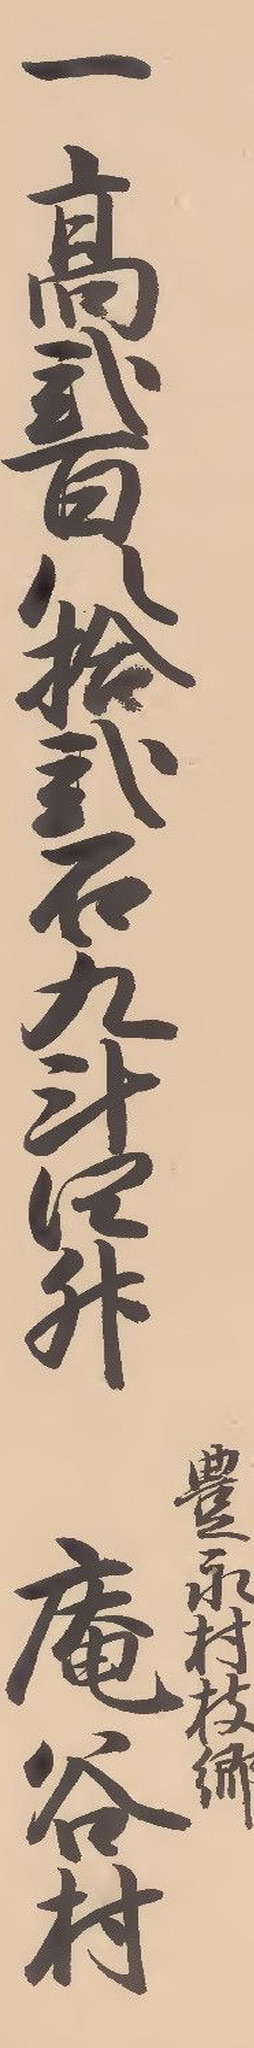一髙弐百八拾弐石九斗四升庵谷村
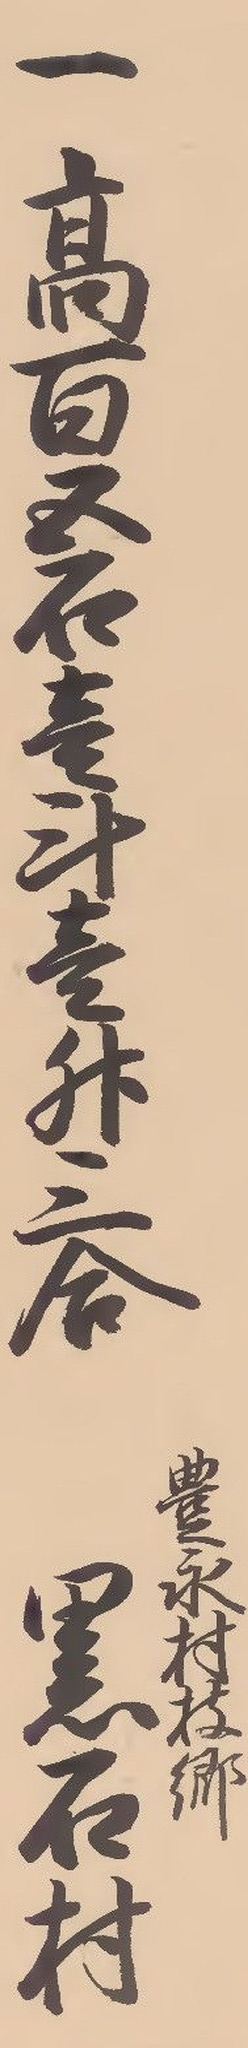一髙百五石壱斗壱升三合黑石村

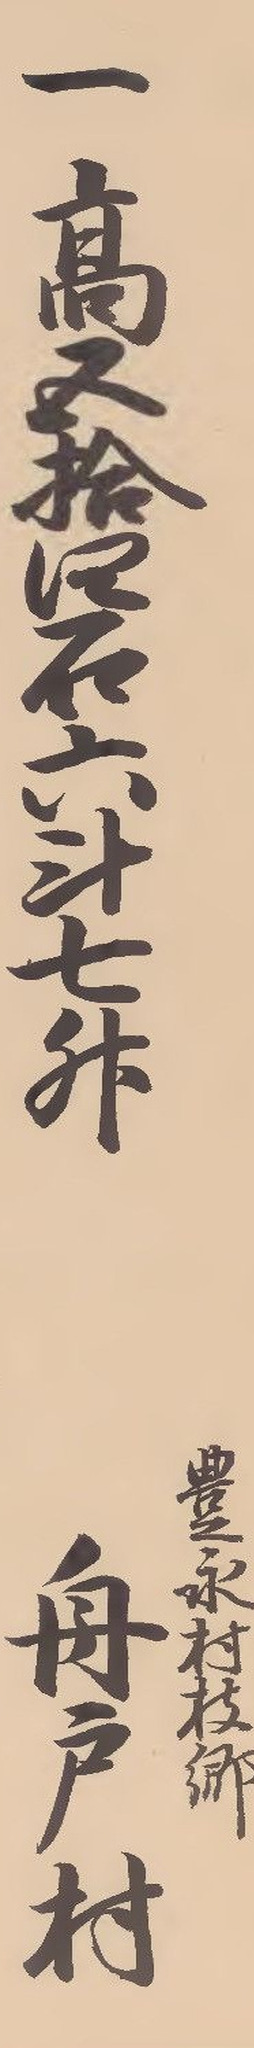一髙五拾四石六斗七升舟戸村
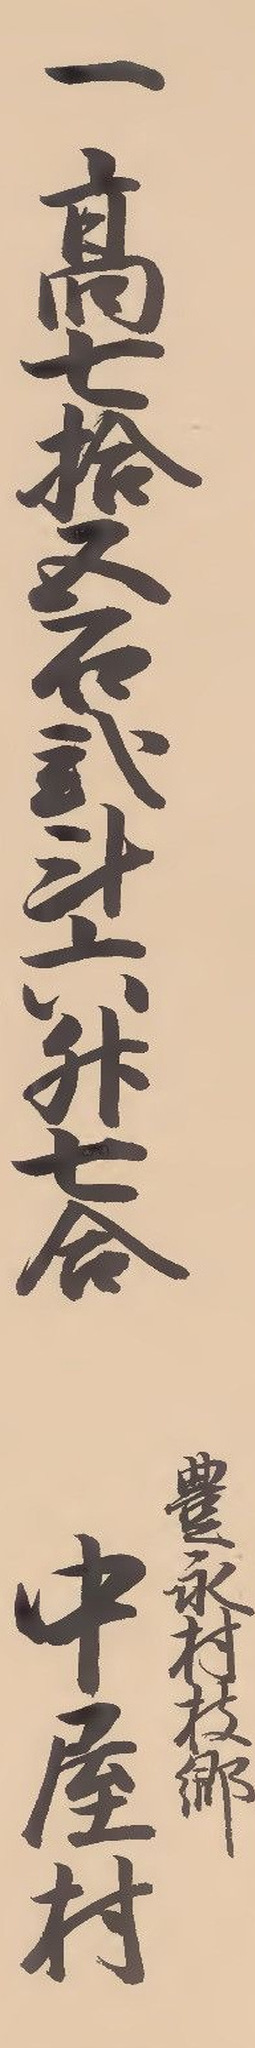一髙七拾五石弐斗六升七合中屋村
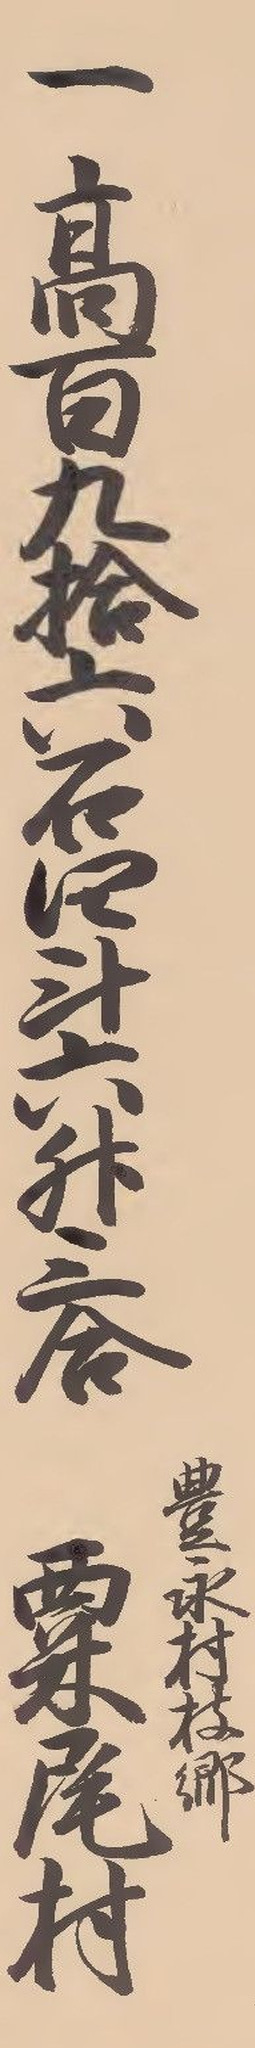一髙百九拾六石四斗六升三合粟尾村
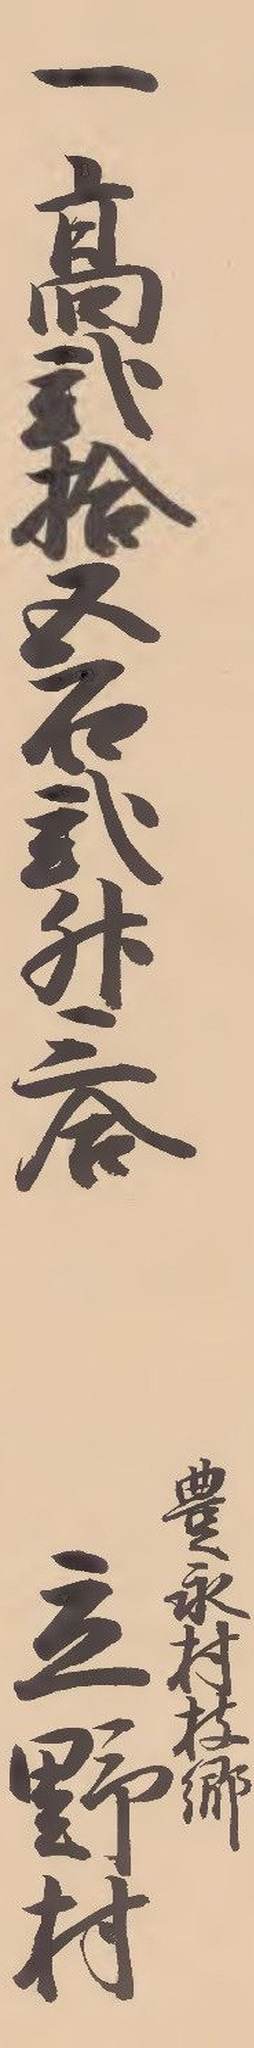一髙弐拾五石弐升三合立野村
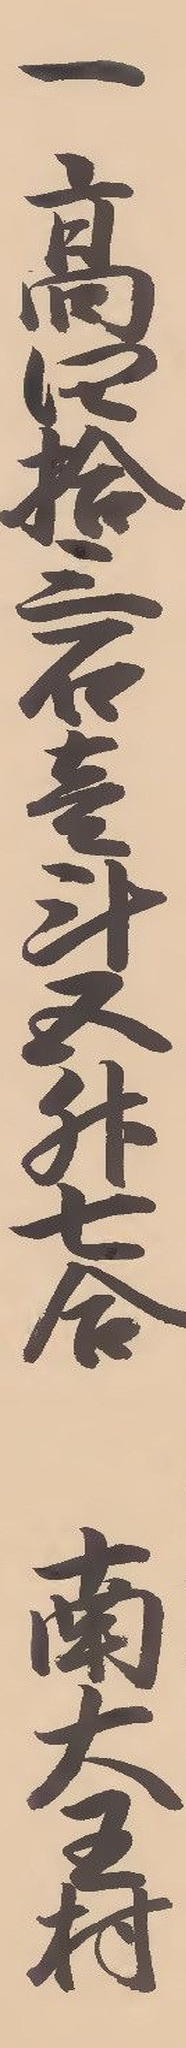一髙四拾三石壱斗五升七合南大王村
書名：土佐国郷帳
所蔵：国立公文書館 National Archives of Japan
